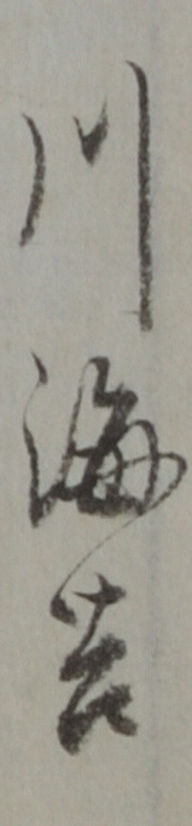川海苔
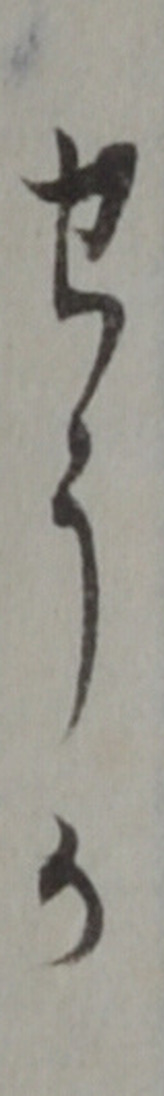せうか
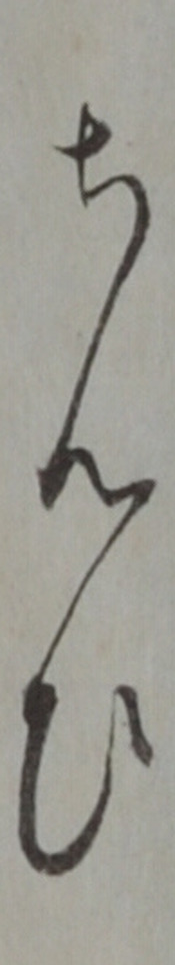ちんひ
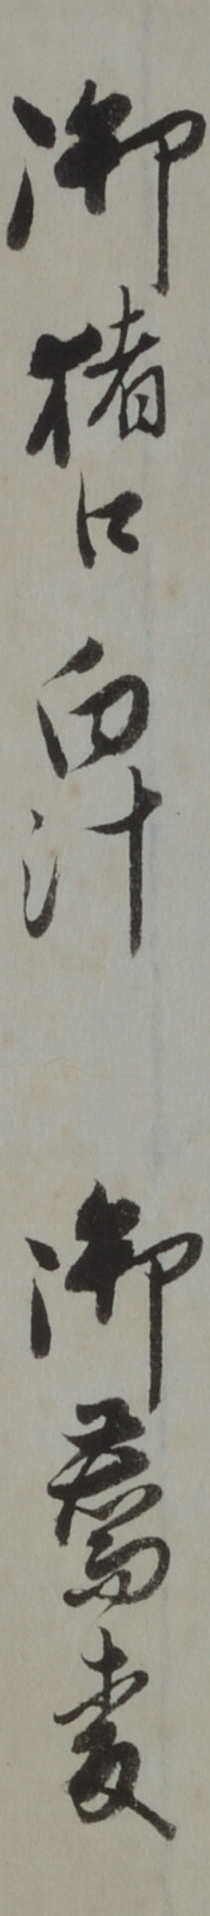御猪口白汁御蕎麦
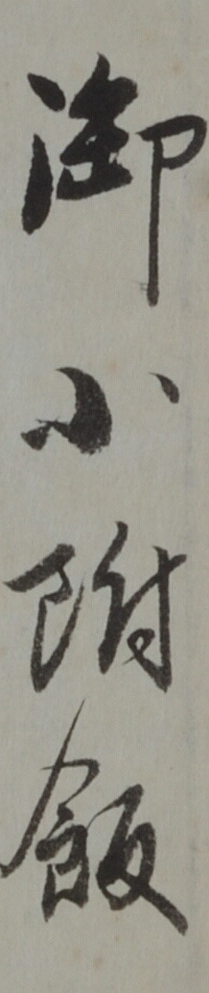御小附飯
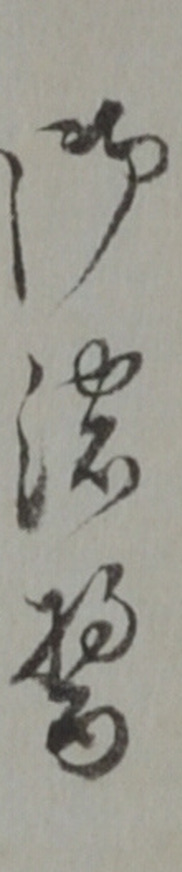御濃醤
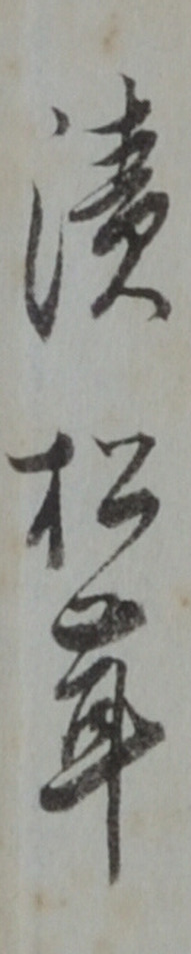漬松茸
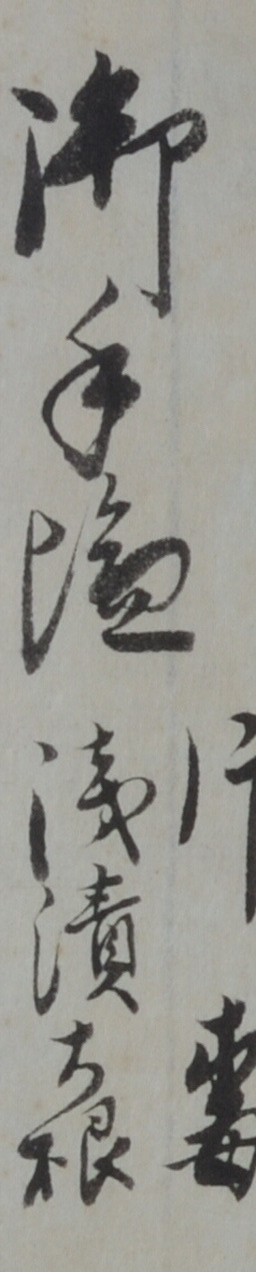御手塩浅漬大根
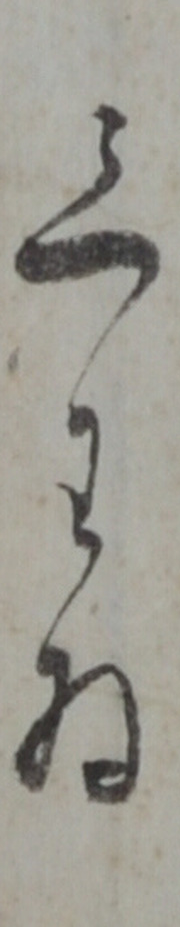くわい
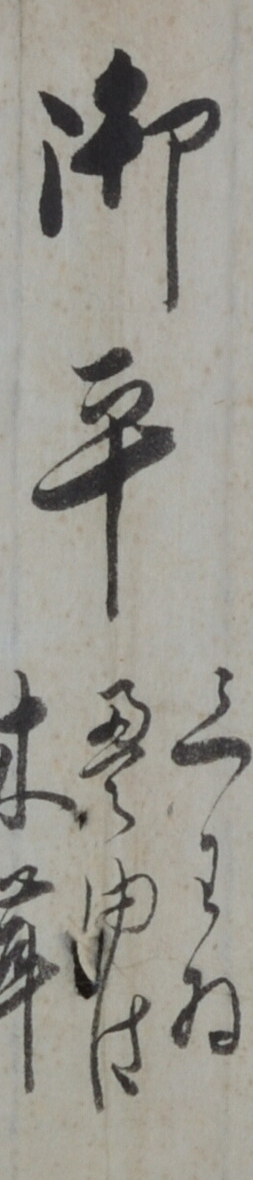御平畳ゆは

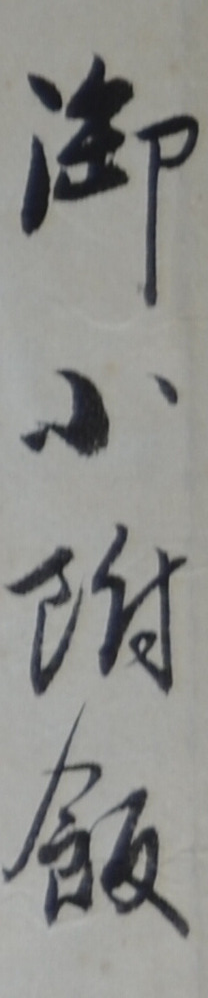御小附飯
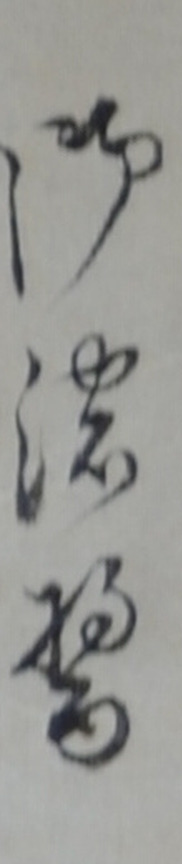御濃醤
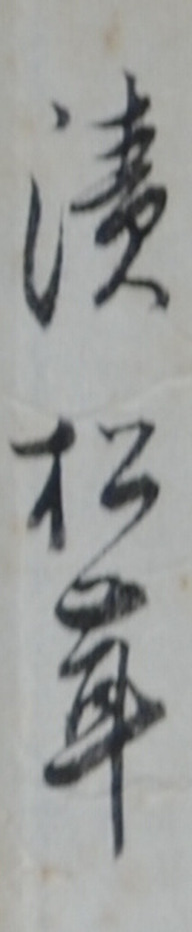漬松茸
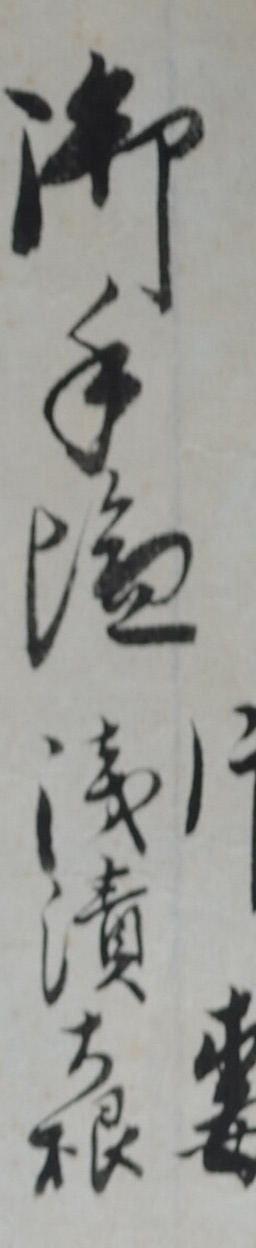御手塩浅漬大根
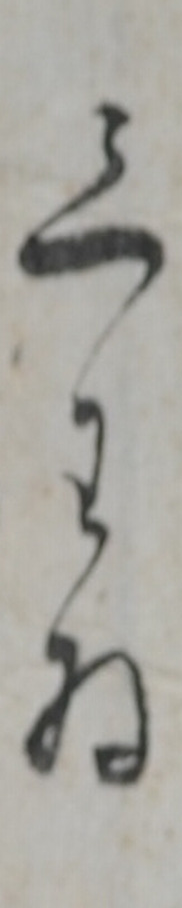くわゐ
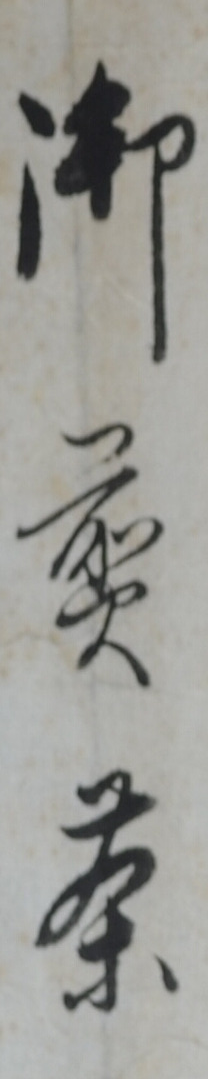御煎茶
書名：献立書上
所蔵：伊那市立高遠町図書館・合同会社AMANE
